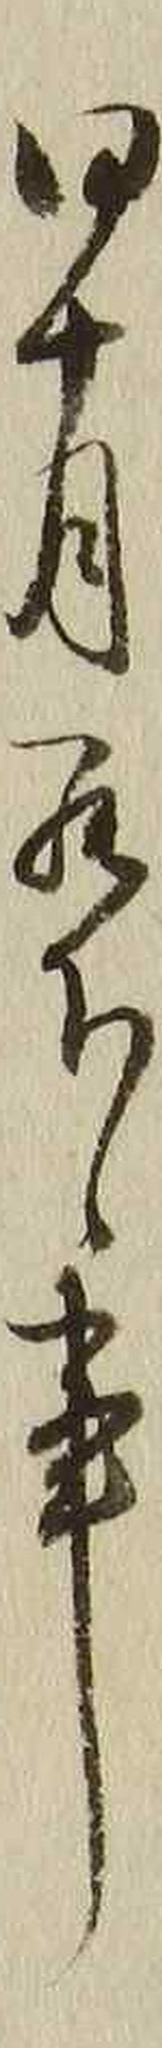同十月罷下候事
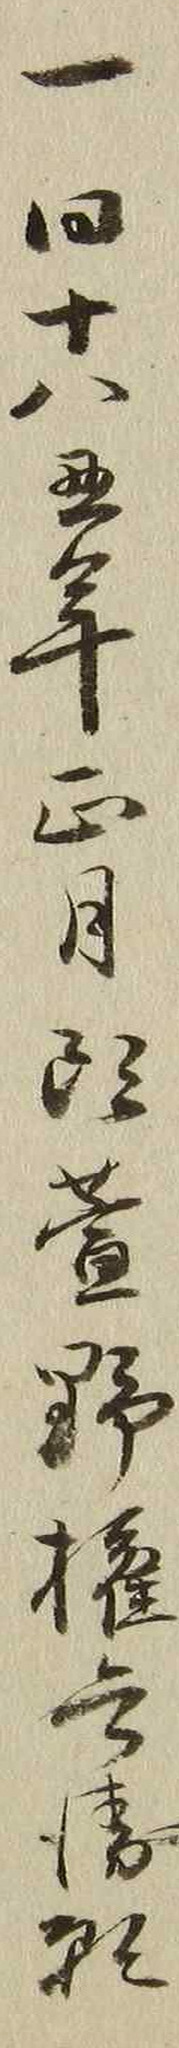一同十八丑年正月頭萱野権兵衛願
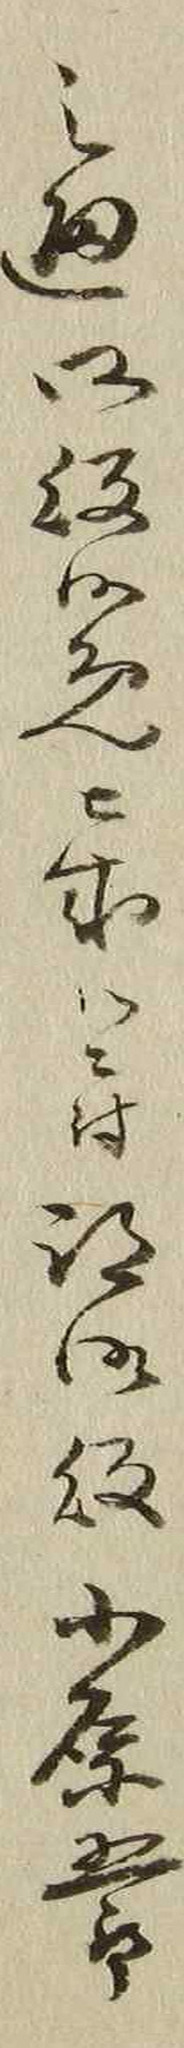之通御役御免被成候ニ付跡御役小原五郎
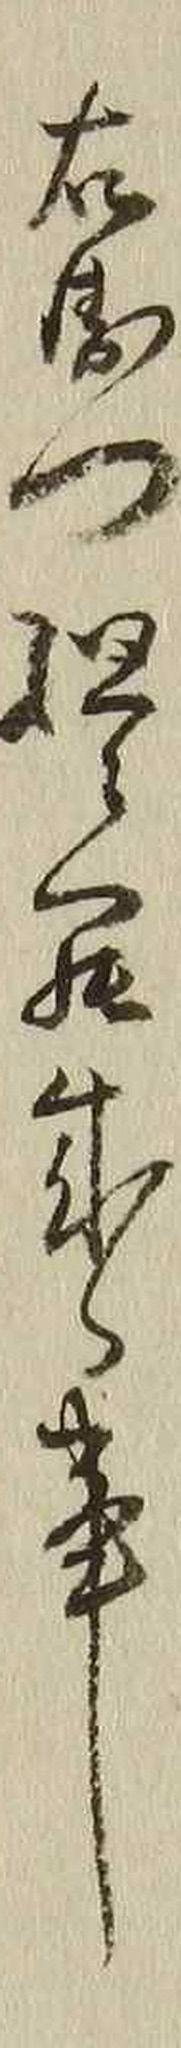右衛門組ニ罷成候事
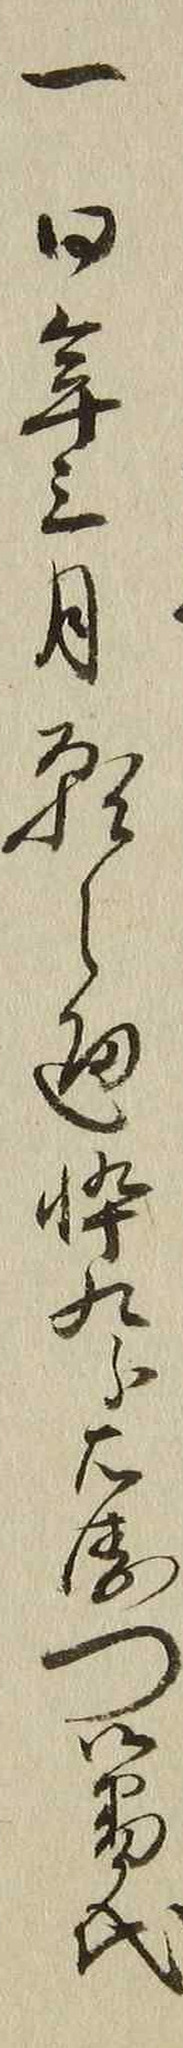一同年三月願之通忰九郎右衛門御番代
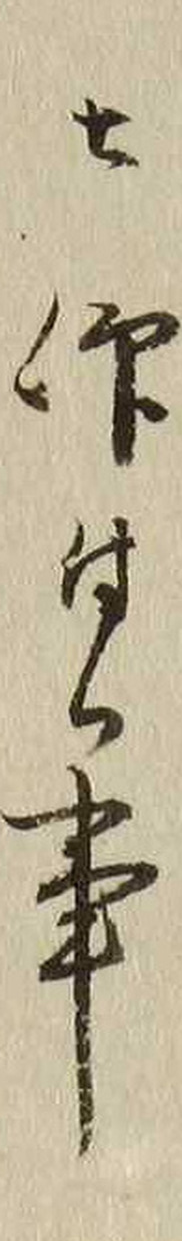被仰付候事
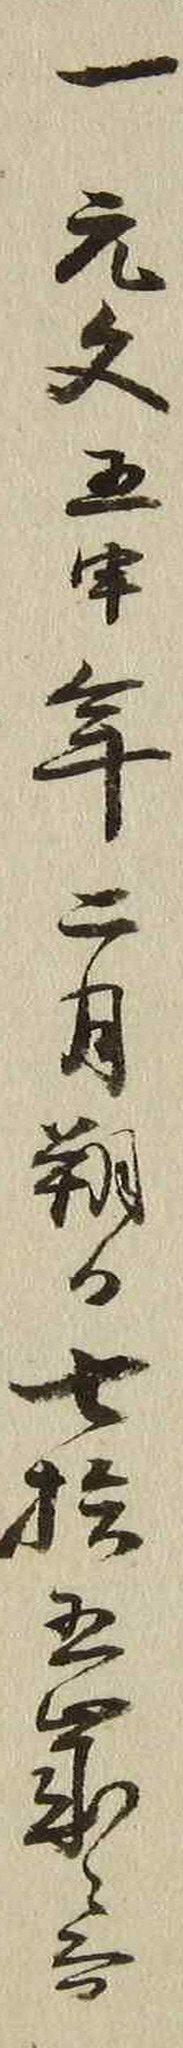一元文五申年二月朔日七拾五歳ニ而
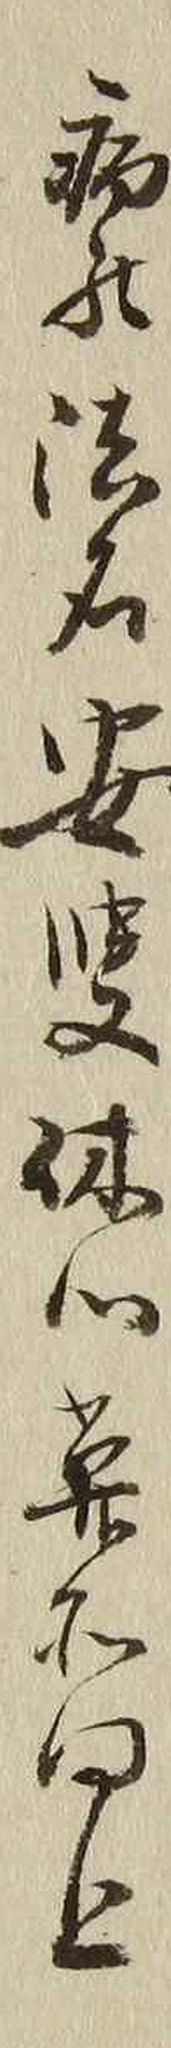病死法名安叟休心葬所同上
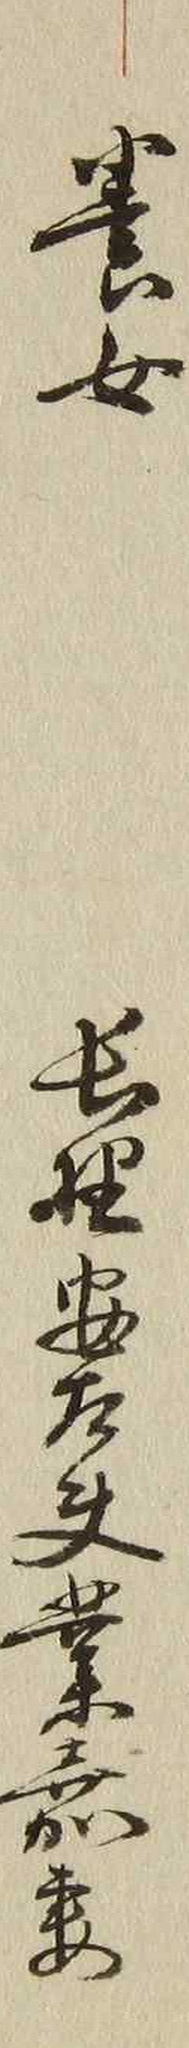養女長野安太夫業嘉妻
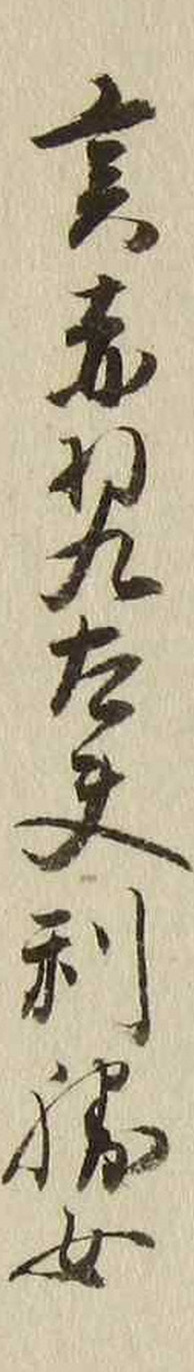実赤羽九太夫利勝女

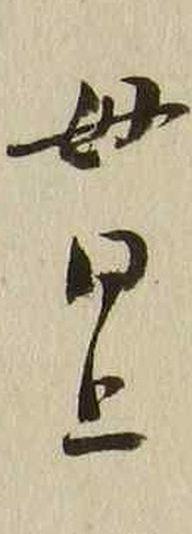母同上
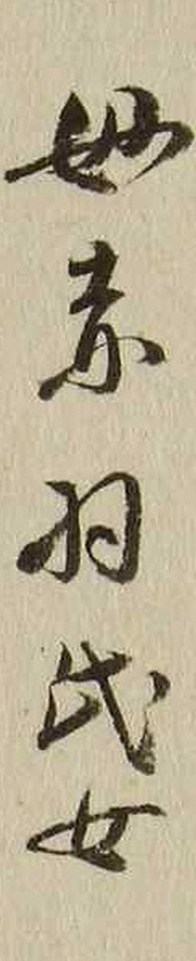母赤羽氏女
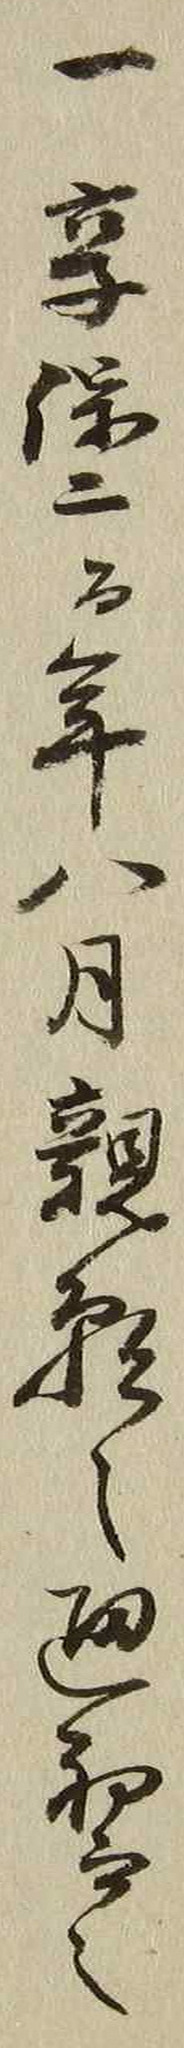一享保二酉年八月親願之通初而之
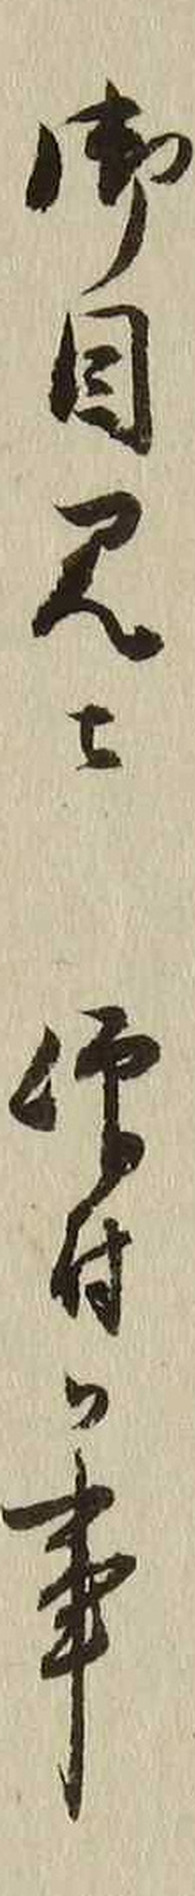御目見被仰付候事
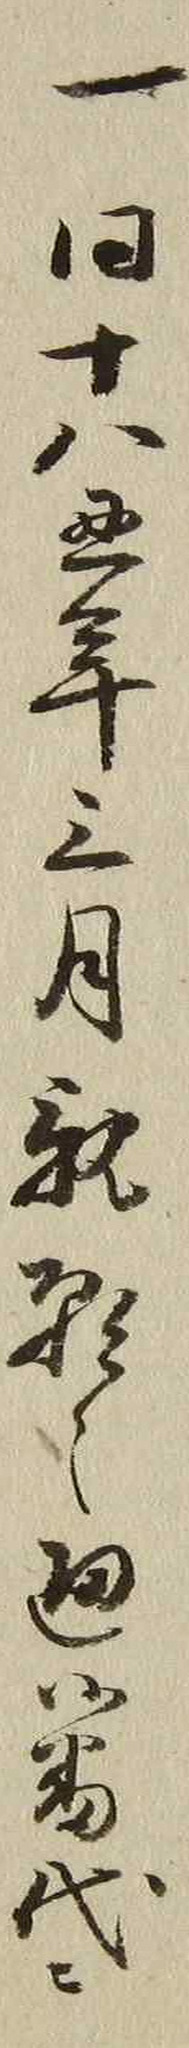一同十八丑年三月親願之通御番代被
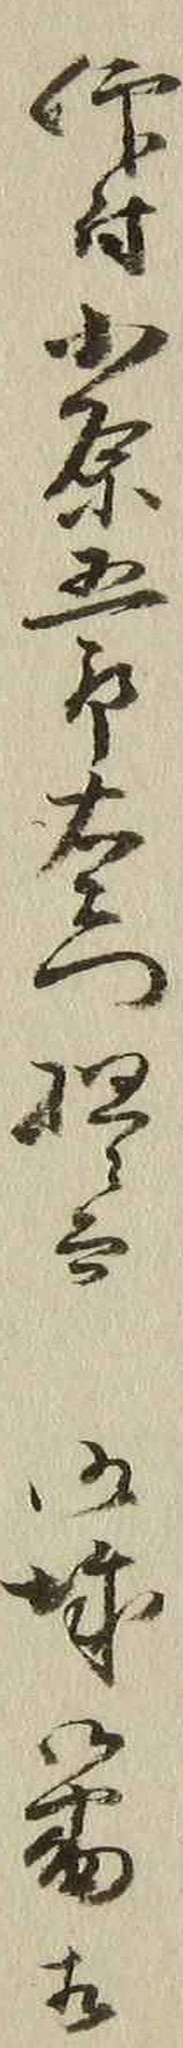仰付小原五郎右衛門組ニ而御城御番相
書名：諸士系譜　巻之236　ふ之部4
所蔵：会津若松市立会津図書館
